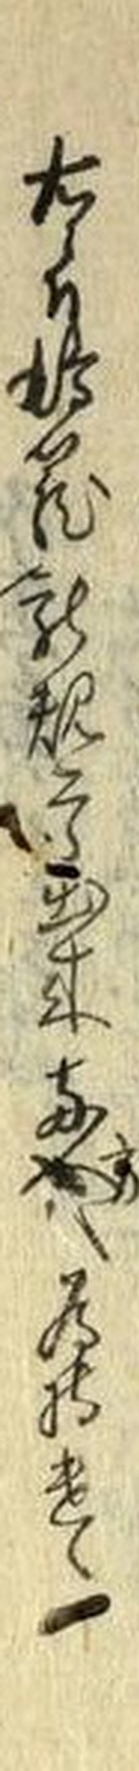右ニ付鳩籠新規二ツ出来両方へ為持遣候
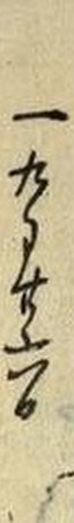一九月廿六日
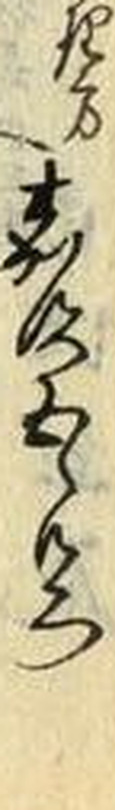森沢五郎左衛門
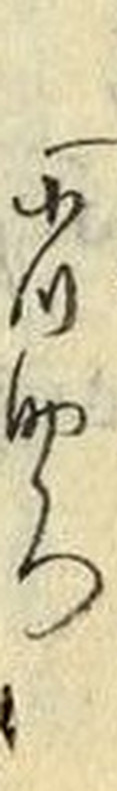小川助右衛門
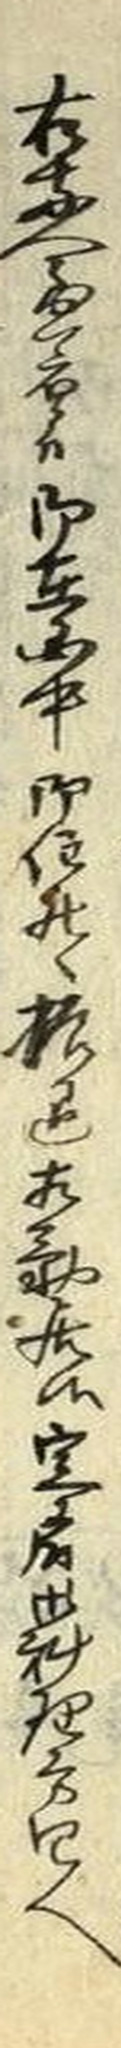右両人到着ニ付御在国中御住居へ振退相勤居候定府御料理方四人
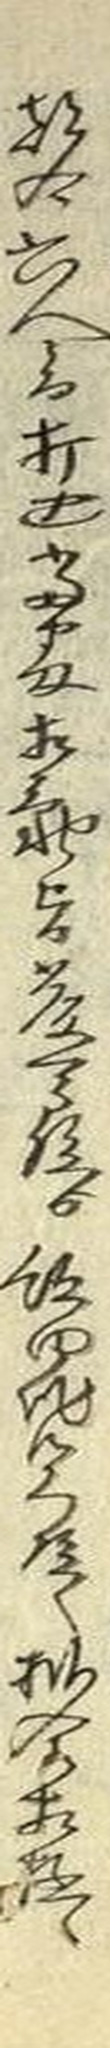都合六人ニ而打込当番相勤旨藤馬殿ゟ飯田作左衛門殿へ掛合相極候
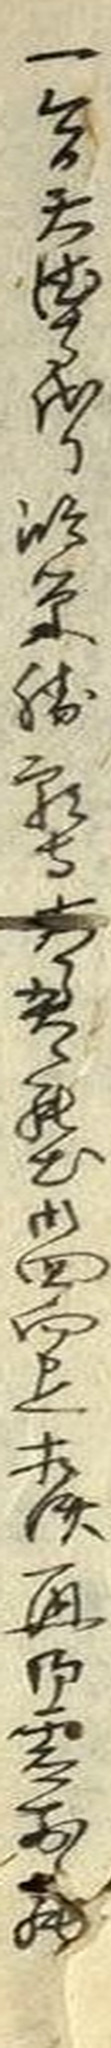一今日天徳寺代り鴻巣勝願寺大奥へ罷出御回向申上相済再御霊前へ罷
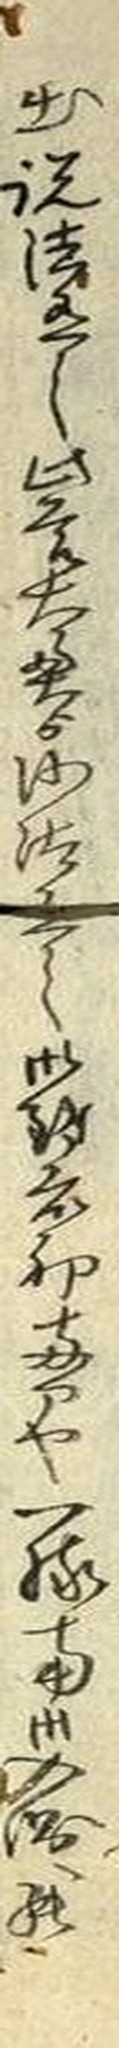出説法有之此節大奥ゟ沙汰有之御附衆初両部や一統南御入側へ罷
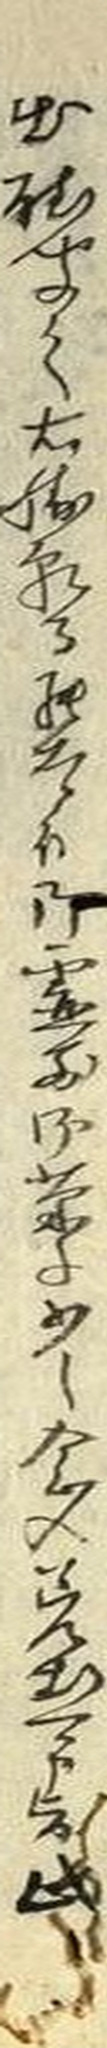出聴聞之右勝願寺罷出候ニ付御霊前御菓子少し今夕念入差出可申旨此
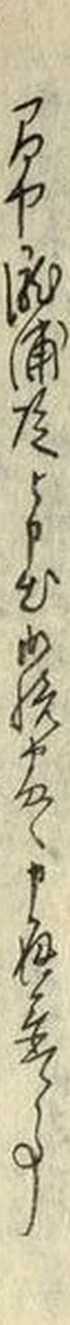間中滝浦殿被申出御膳番へ申通置候事
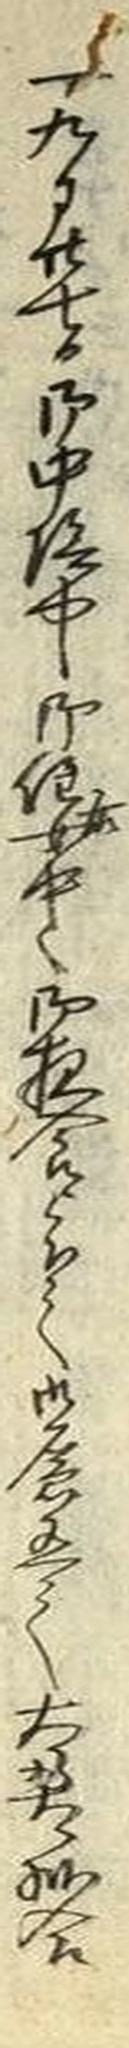一九月廿七日御中陰中御住居女中之御夜食被下之御廉有之大奥へ掛合
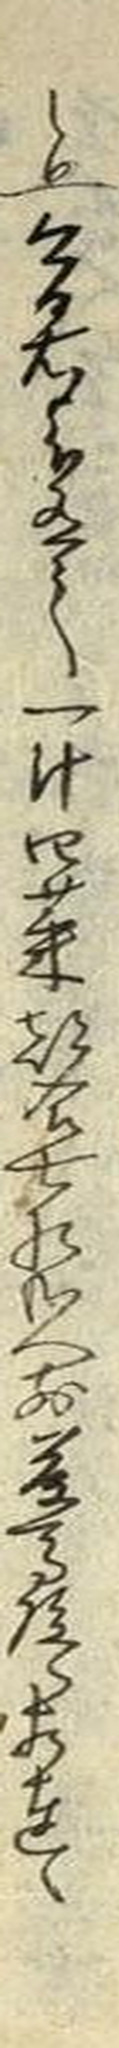之上今日右被下有之一汁四菜都合七拾弐人前藤馬殿へ相達候
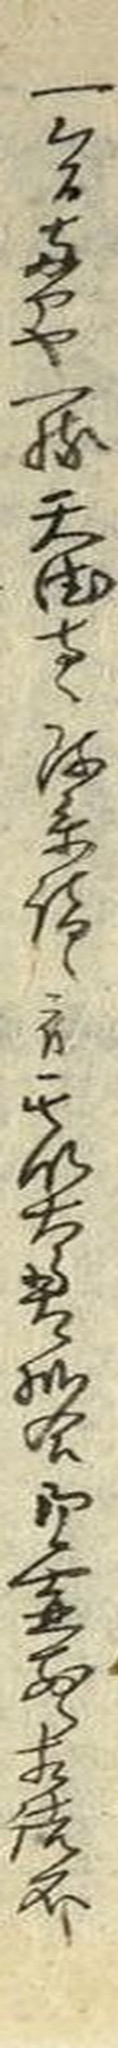一今日両部や一統天徳寺へ致参詣候ニ付其段大奥掛合御霊前へ相詰不
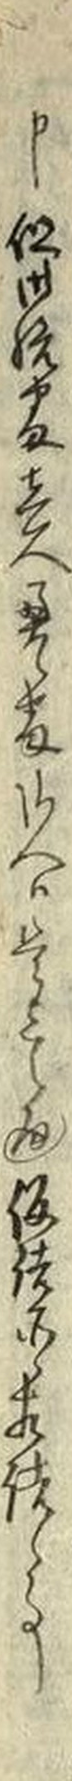申但御膳番壱人奥之番弐人ハ是迄之通仮詰所へ相詰候事
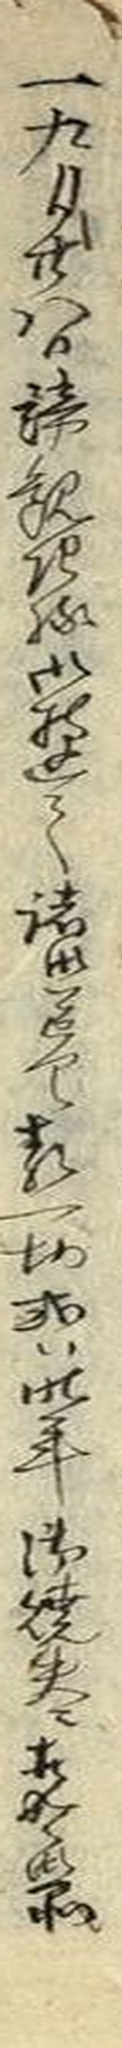一九月廿八日諦観院様御持込之諸御道具類一切或ハ昨年御焼失ニ相成候御品
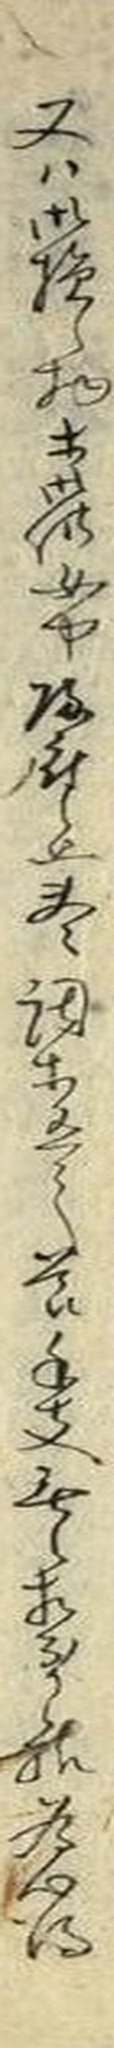又ハ御損之物等御供女中帰府之上夫々調等有之節手支無之相分り候様為心得
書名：少傅日録抄（斉善付側向頭取日記、江戸并道中、初入在国、逝去後…
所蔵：福井県文書館 Fukui Prefectural Archives
